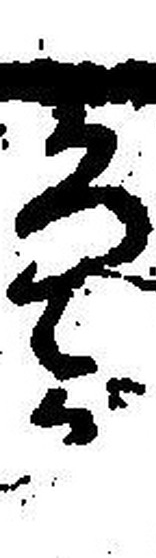かつてが
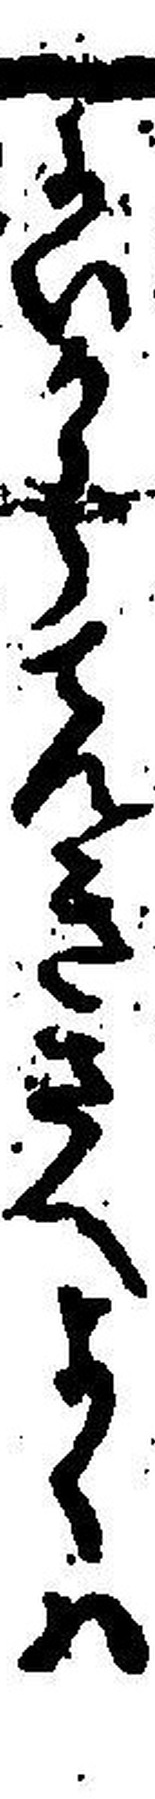よいからてんきさへよくは
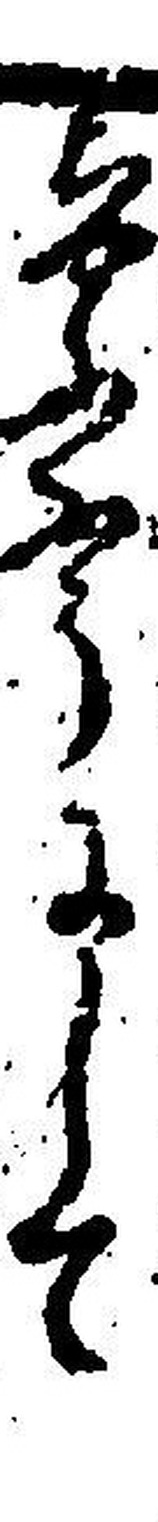ちやふやうにして
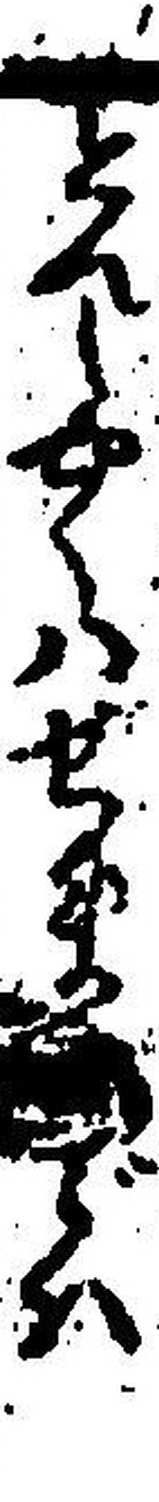とんしやくはせまでは
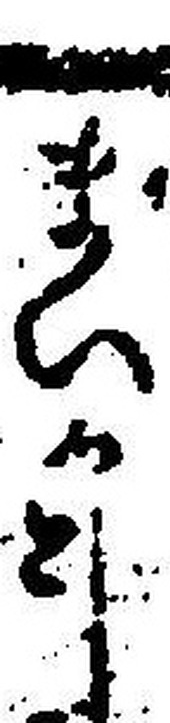まいかと

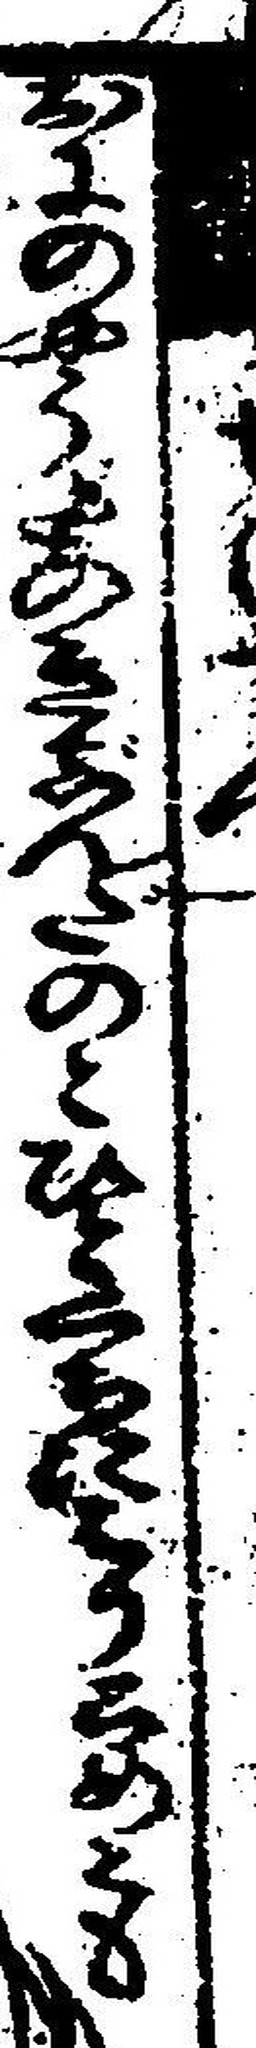おにのようのきじんだのとひとくちにはりこめとも
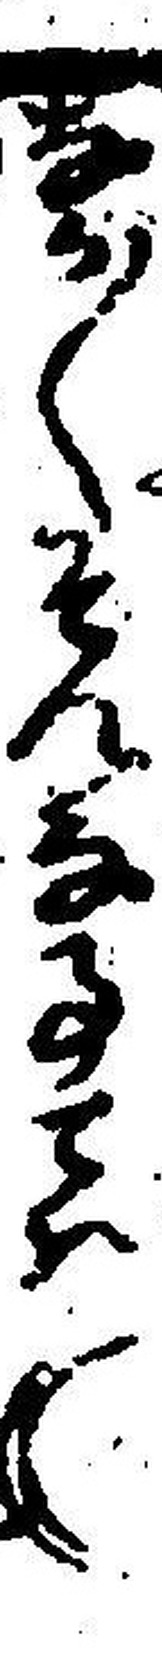なか〳〵そんな事ては
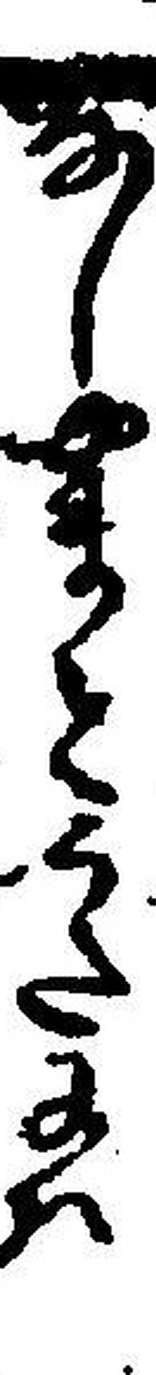なしやまとうたには
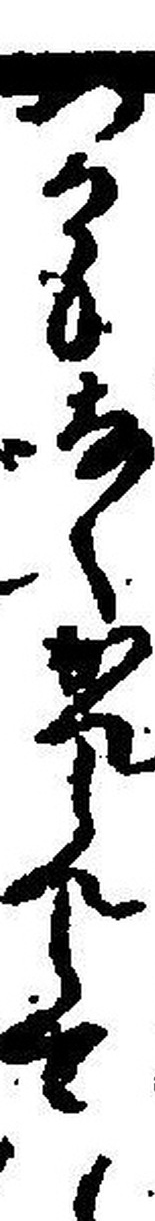つかもなくかんしんして
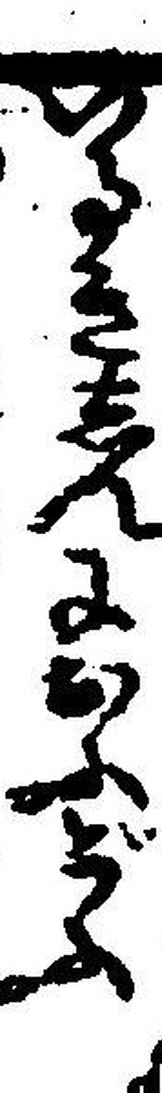いるきじんにおふどふ
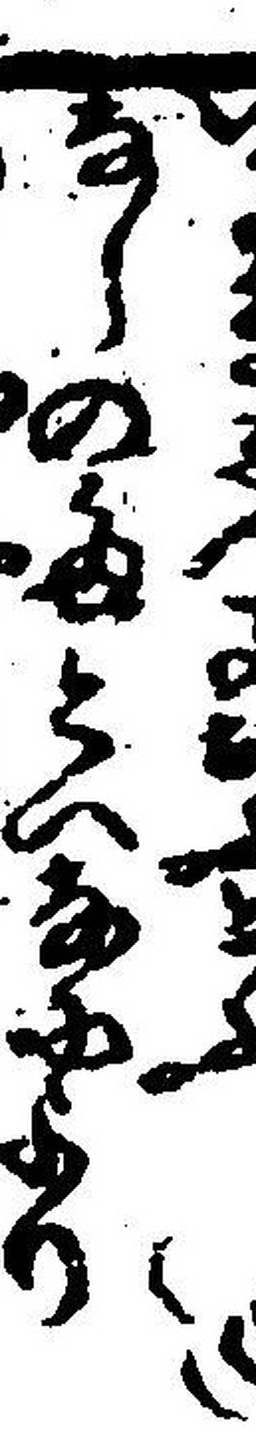なしのたといなにより
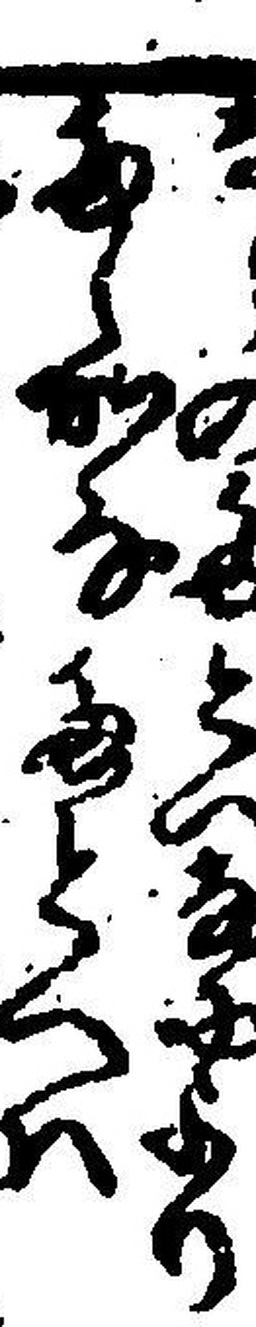たしかなたとへは
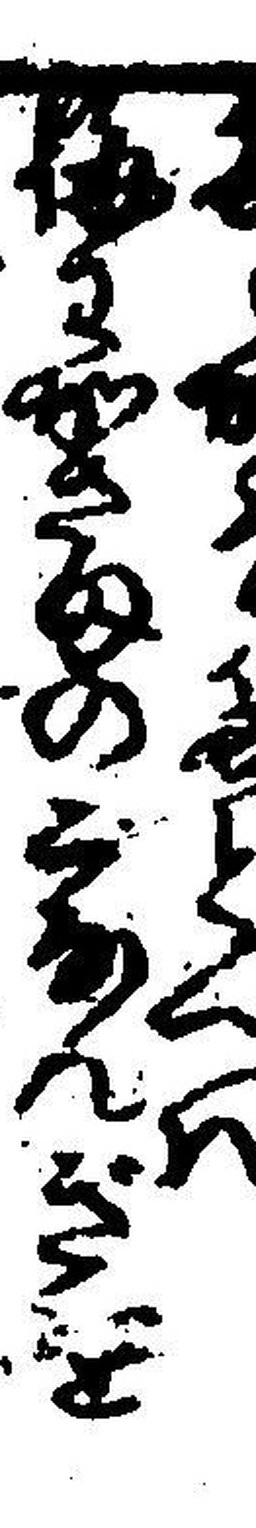梅わかさまのこなんぎを
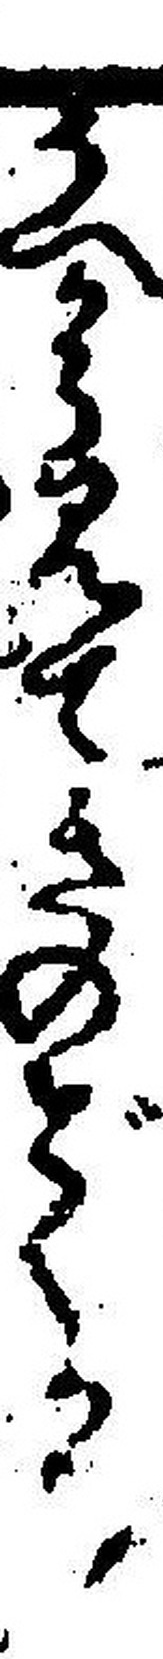うへから見てきのどくか
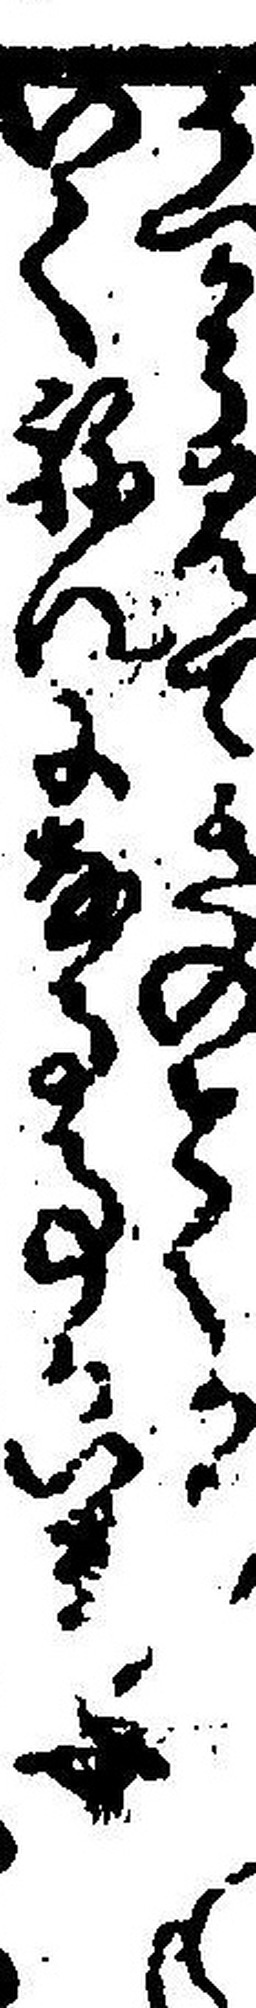いくねんになる事かいま
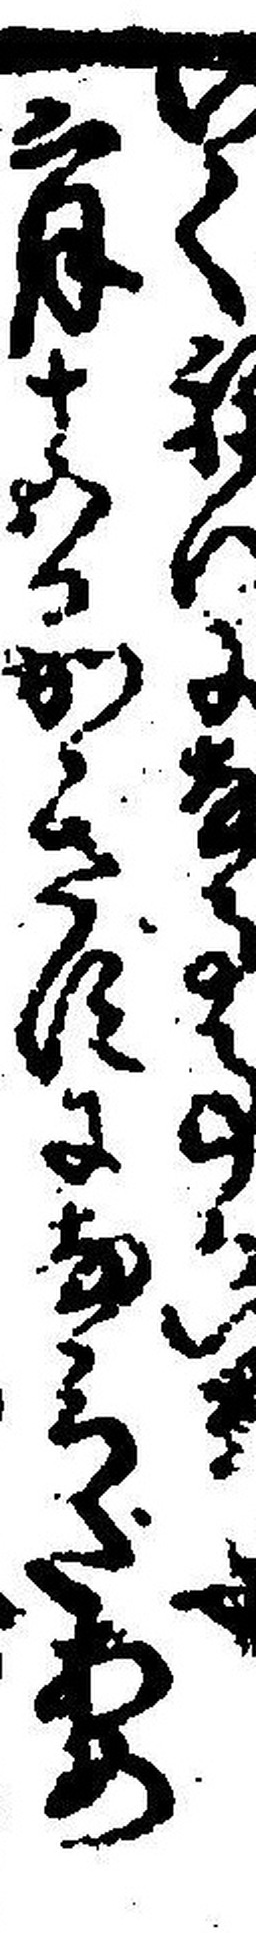二月十五日かゝさすなみたあめ
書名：天竺儲之筋 / 市場通笑作
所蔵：東京大学総合図書館 General Library in the University of Tokyo, JAPAN
